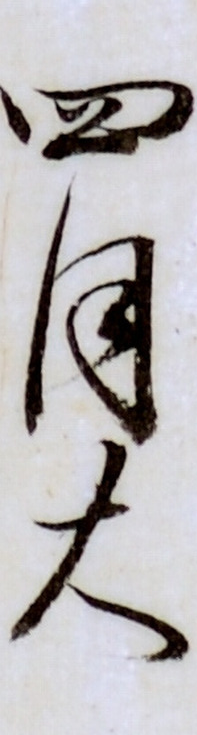四月大
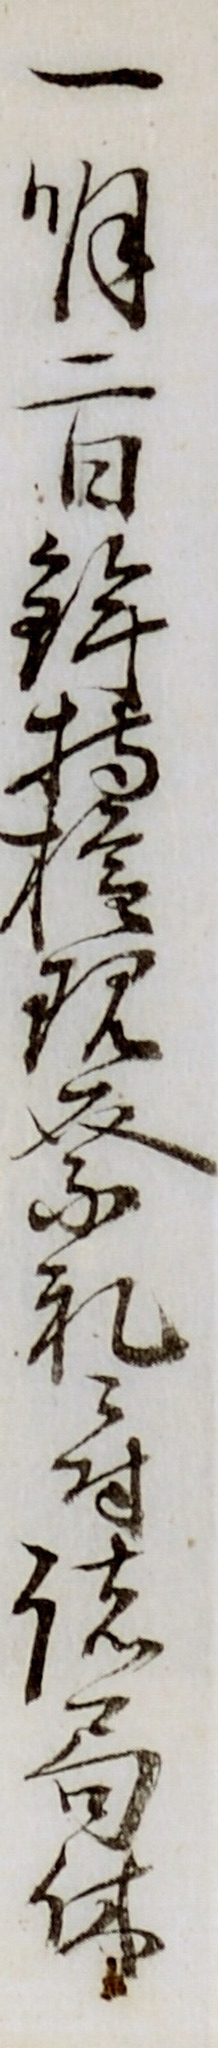一明二日鉾持権現祭礼に付諸局休
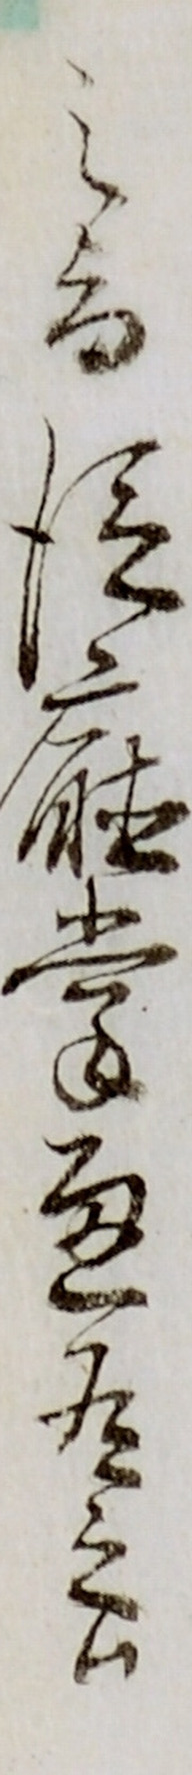之旨従庁掌通有之候
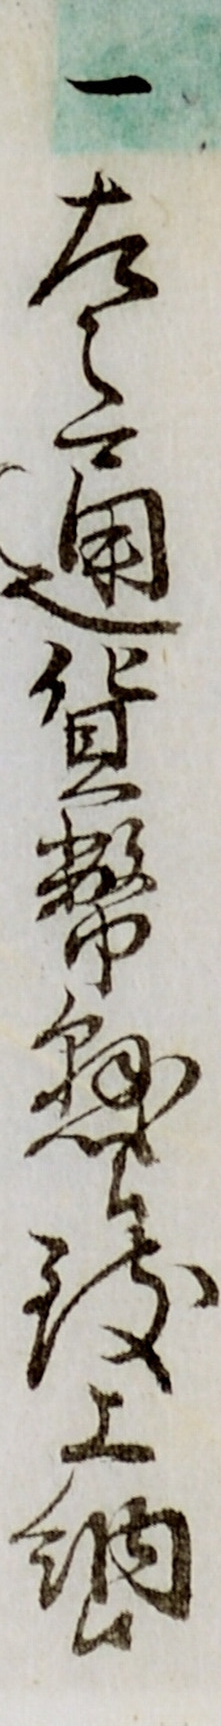一左之通貨幣懸え致上納候
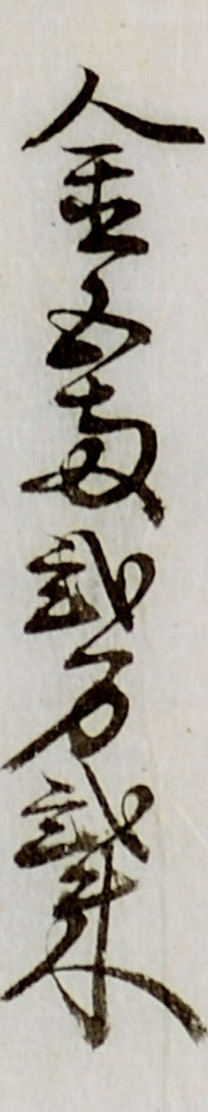金五両弐分弐朱
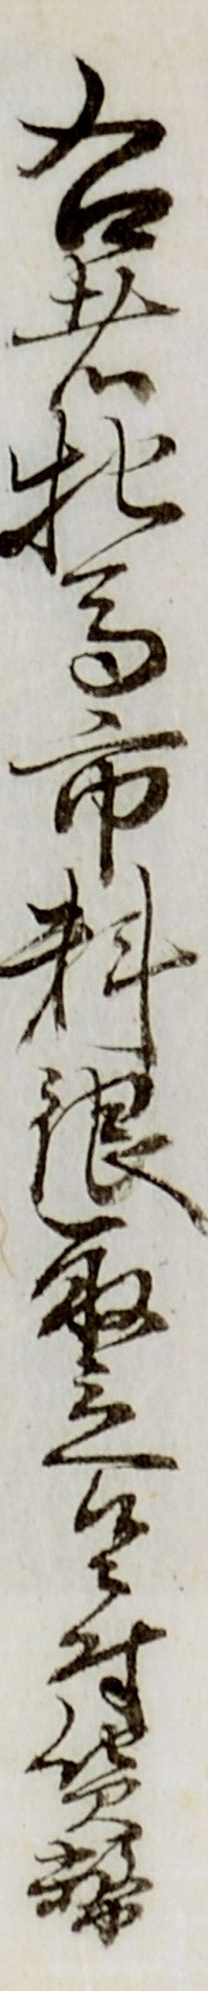右は牝馬市料銀取立候に付貨幣
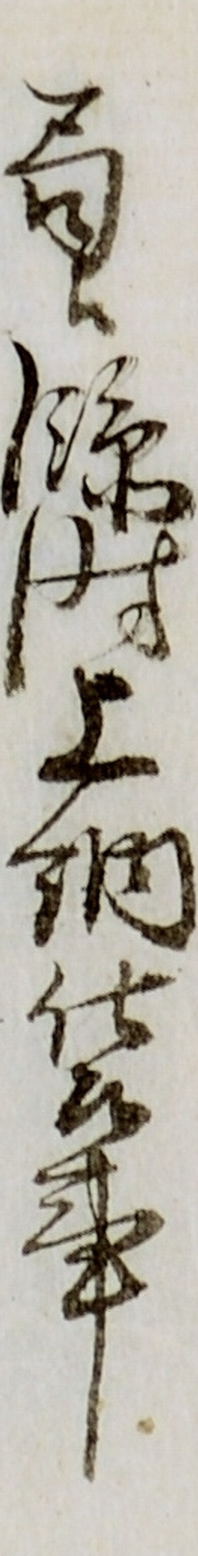局え臨時上納仕候事
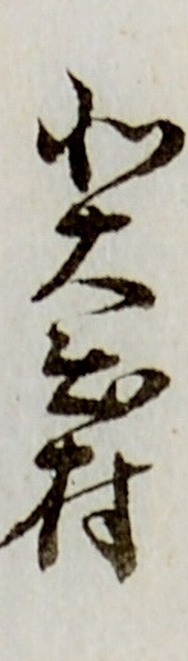北大出村
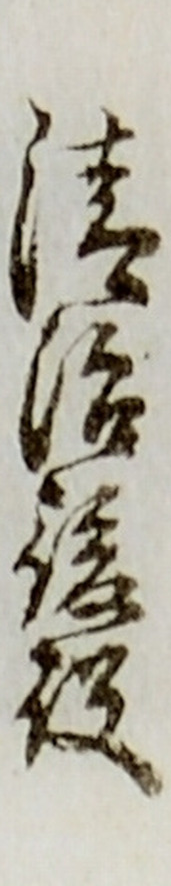清治後役
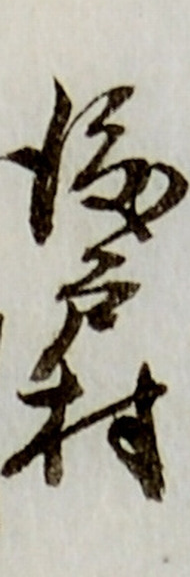渡戸村
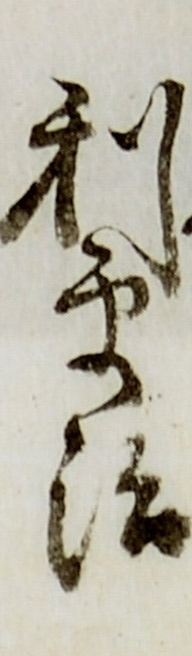利平治
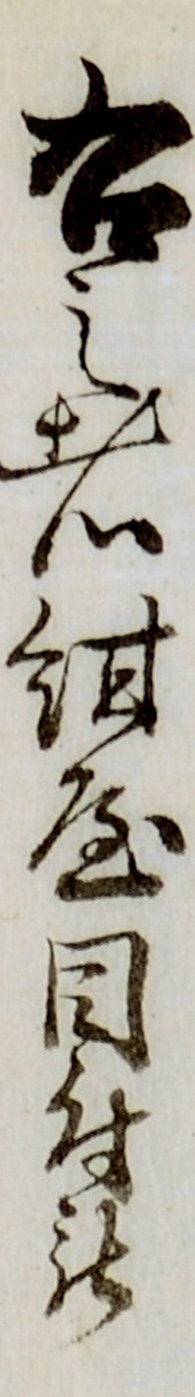右之者紺屋目付被
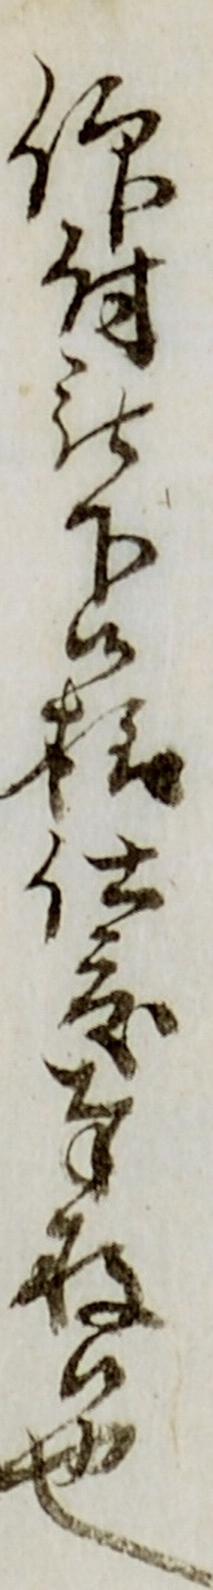仰付被下候様仕度奉存候也
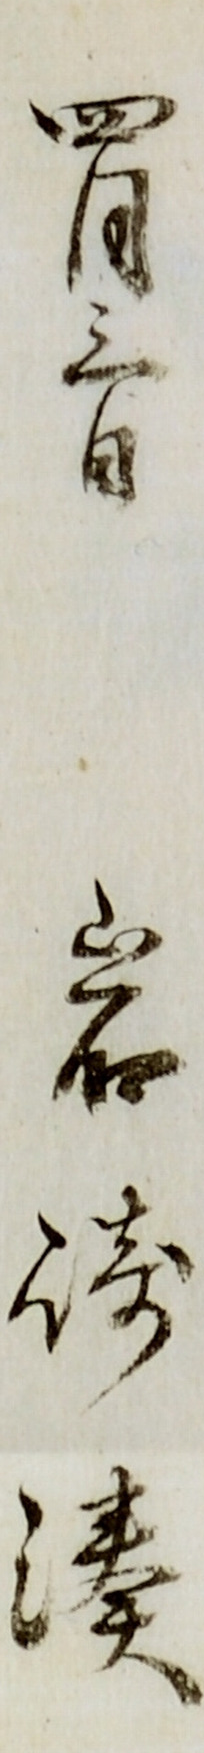四月三日岩崎湊
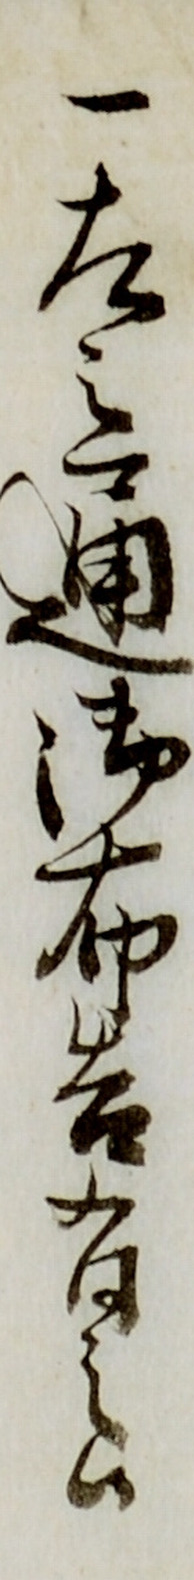一左之通御布告有之候
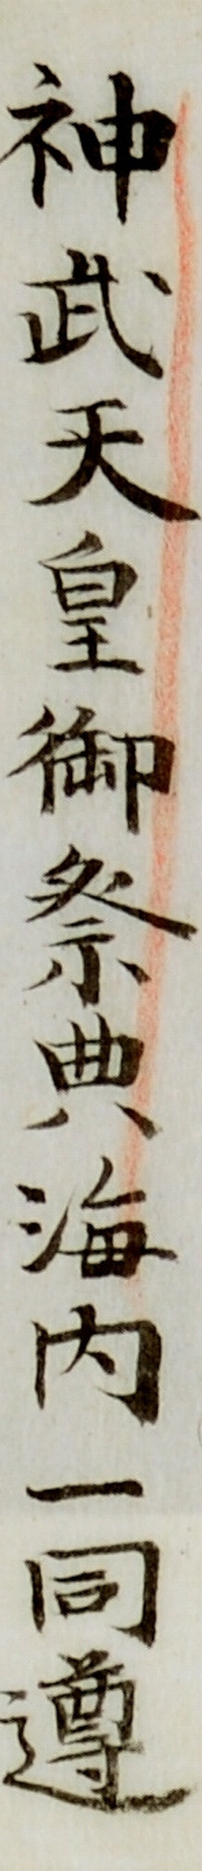神武天皇御祭典海内一同遵
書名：山林方諸事御用留
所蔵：伊那市立高遠町図書館・合同会社AMANE
